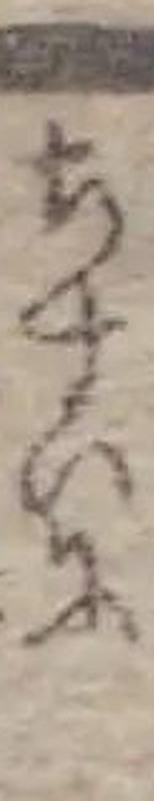ちすいに
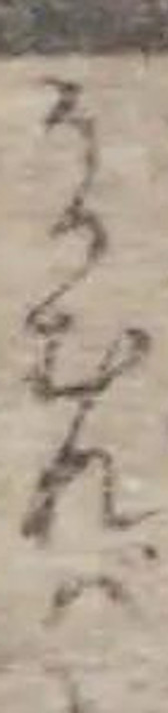うかむれば
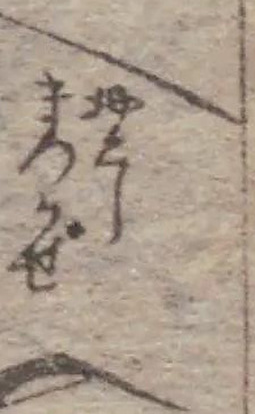おとし
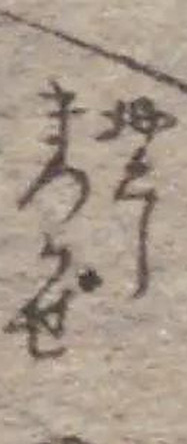おとし
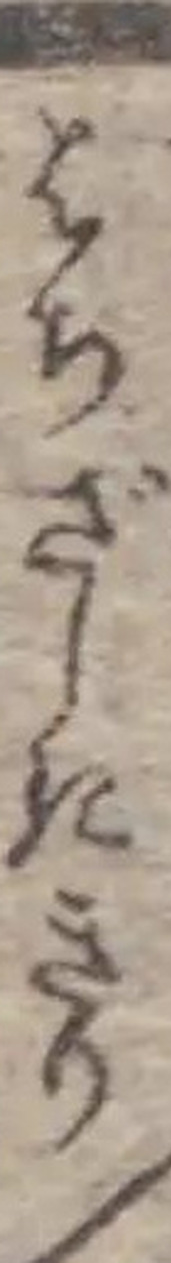はちざしききり
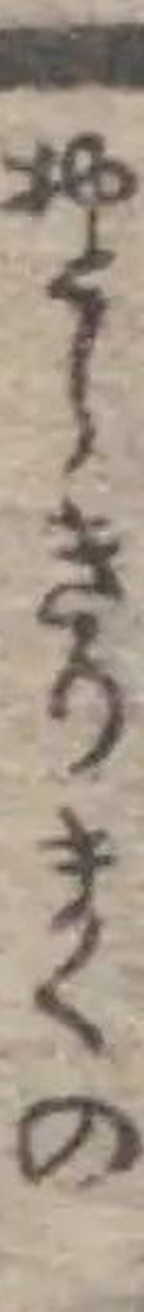おとしきりまくの
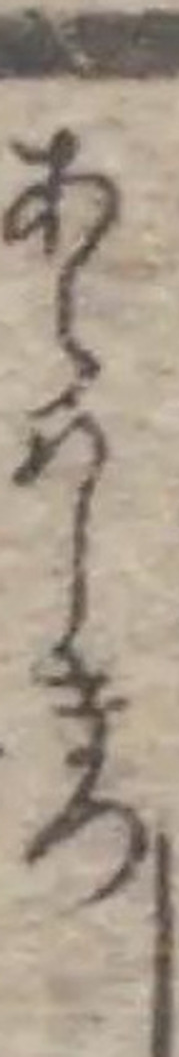あらはしまつ
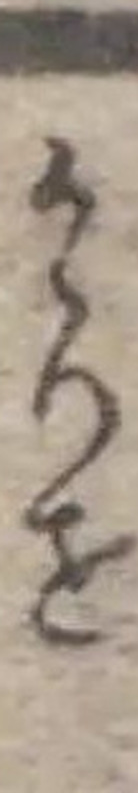くゝりを
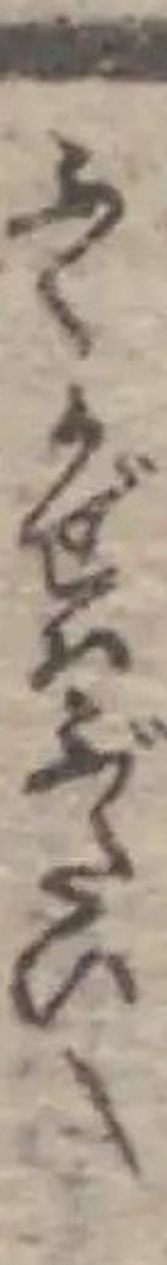ふくかぜはぶたい
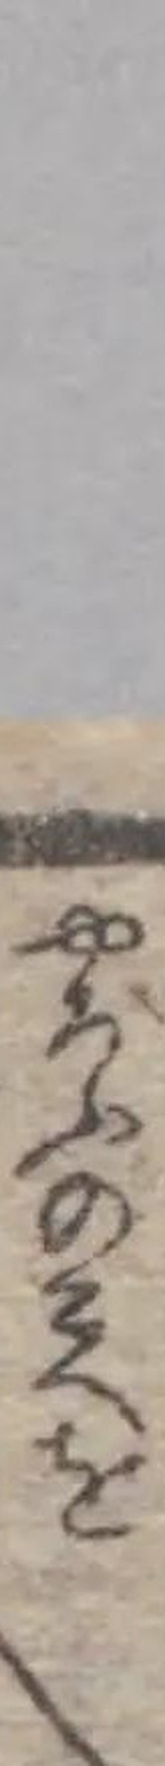やろふのこへを
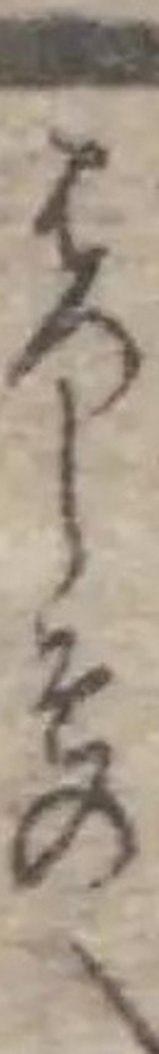はつしその
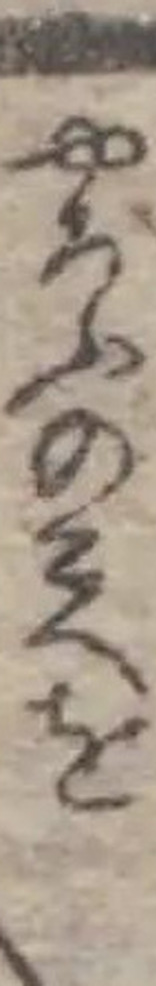やろふのこへを
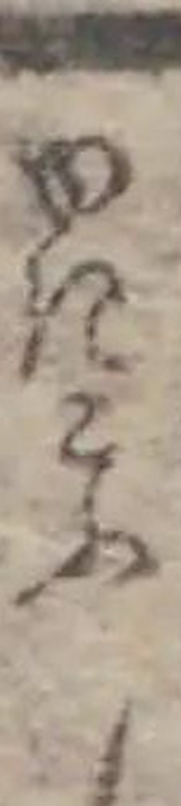ゆきこふ
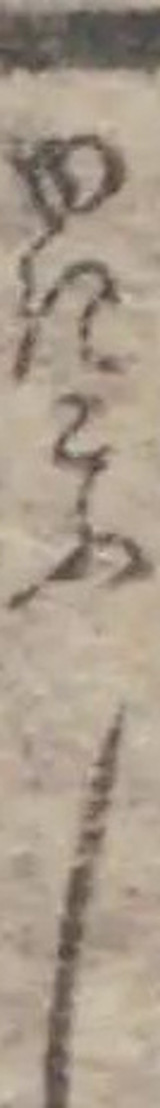ゆきこふ
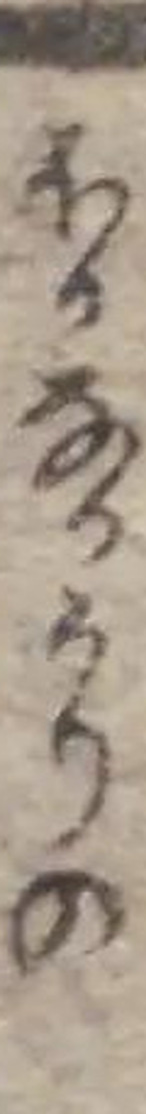ほかなかくりの
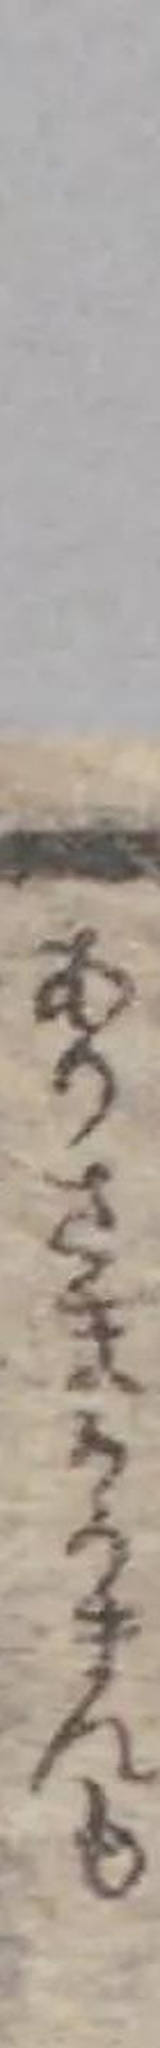ありさまかうまんも
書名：富多高慢噺 3巻
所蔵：国立国会図書館 National Diet Library, JAPAN
